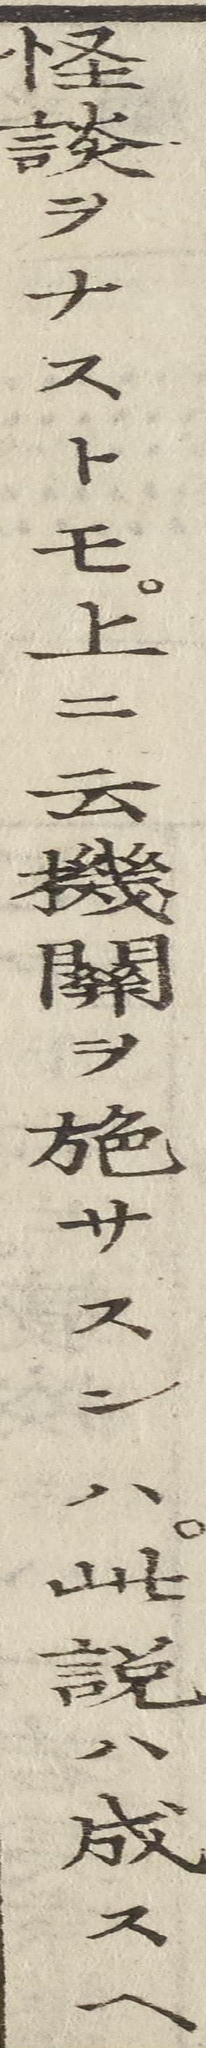怪談ヲナストモ。上ニ云機関ヲ施サスンハ。此説ハ成スヘ
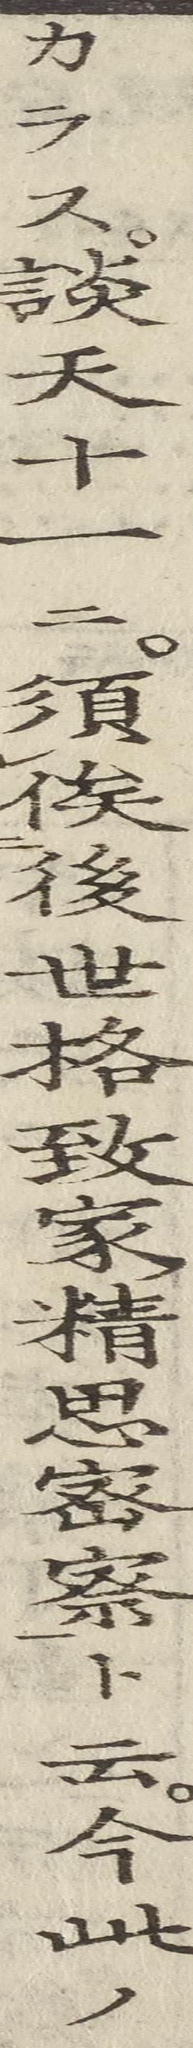カラス。談天十一ニ。須俟ニ後世格致家精思密察ト云。今此ノ
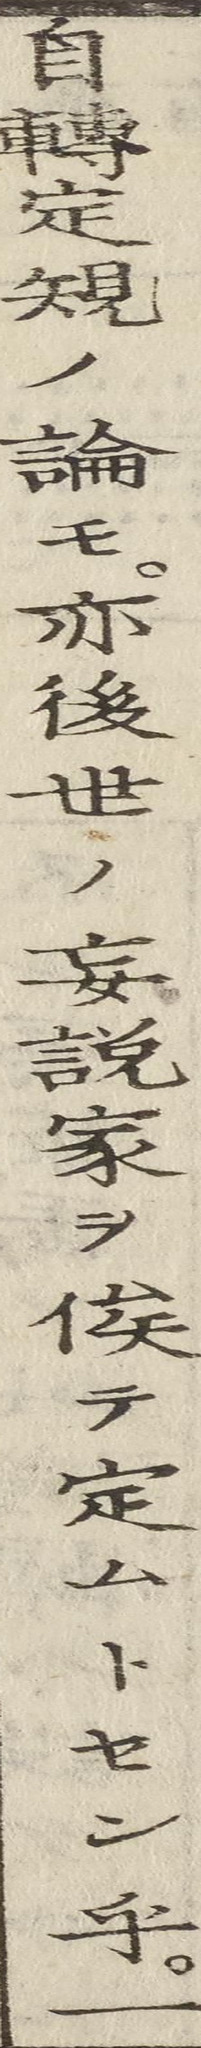自転定規ノ論モ。亦後世ノ妄説家ヲ俟テ定ムトセン乎。一
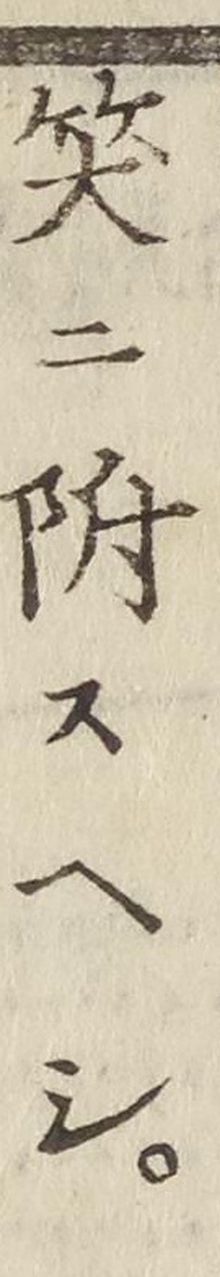笑ニ附スヘシ。
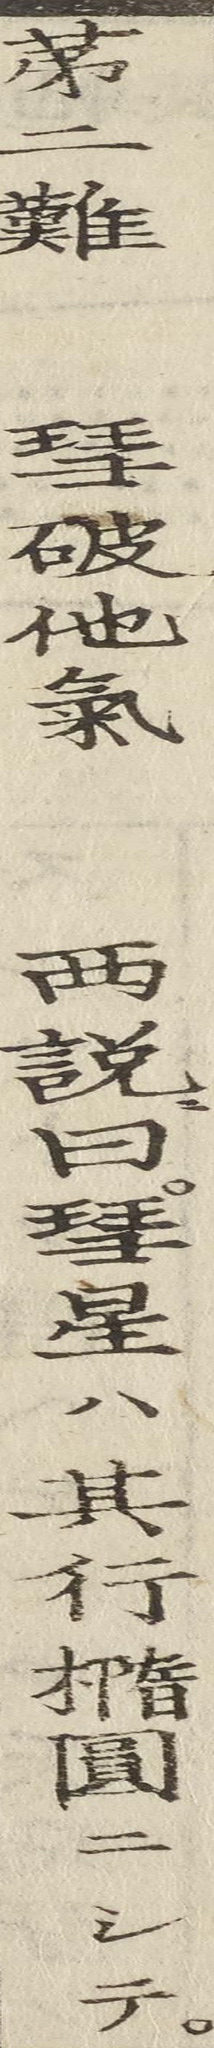第二難彗破他気西説曰。彗星ハ其行楕円ニシテ。
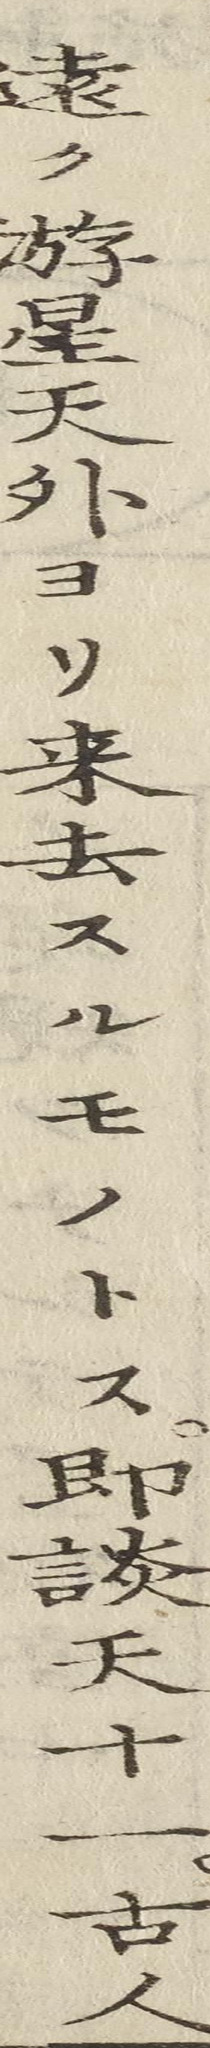遠ク游星天外ヨリ来去スルモノトス。即談天十一。古人
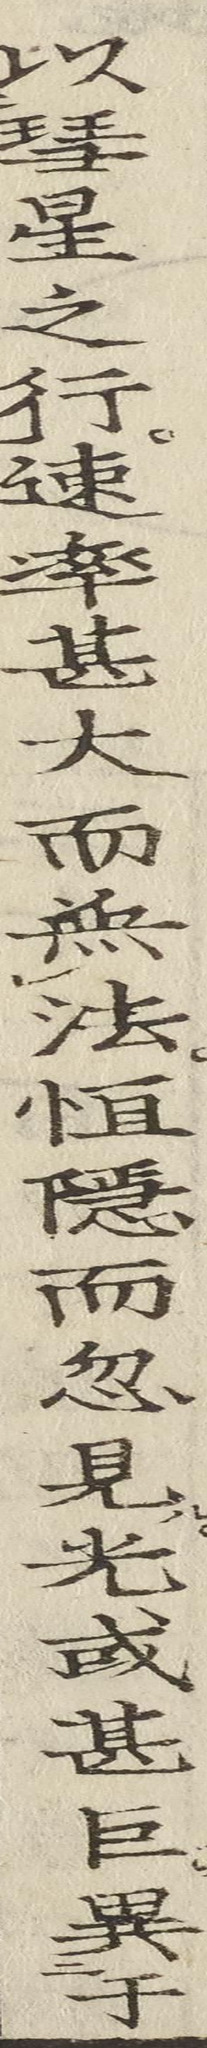以ニ彗星之行。速率甚大而無法。恒隠而忽見。光或甚巨。異ニ干
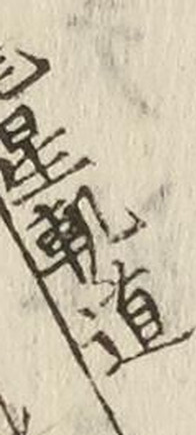尾星軌道
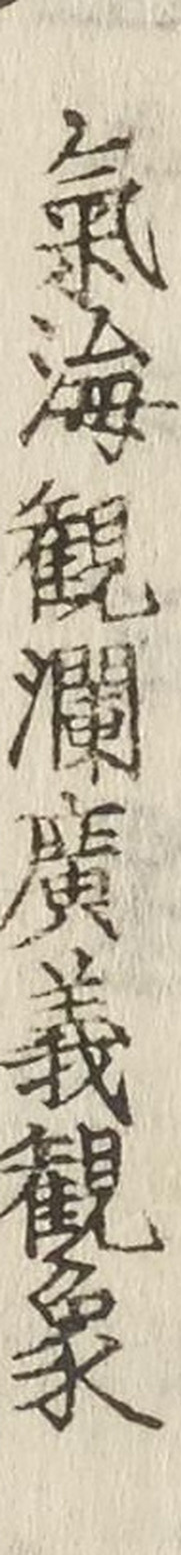気海観瀾広義観象
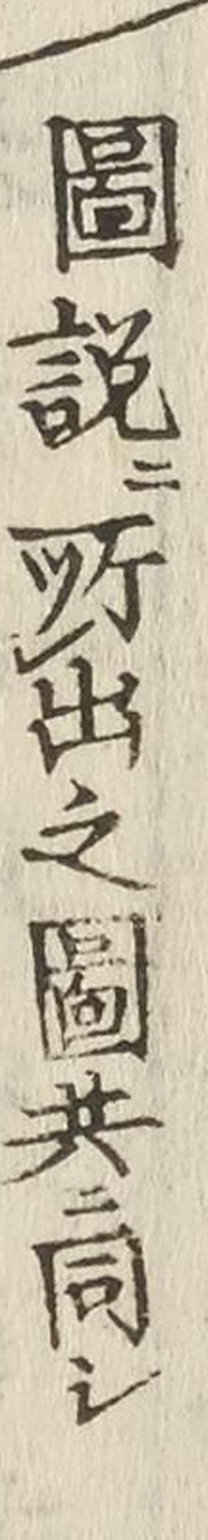図説所出之図共ニ同シ
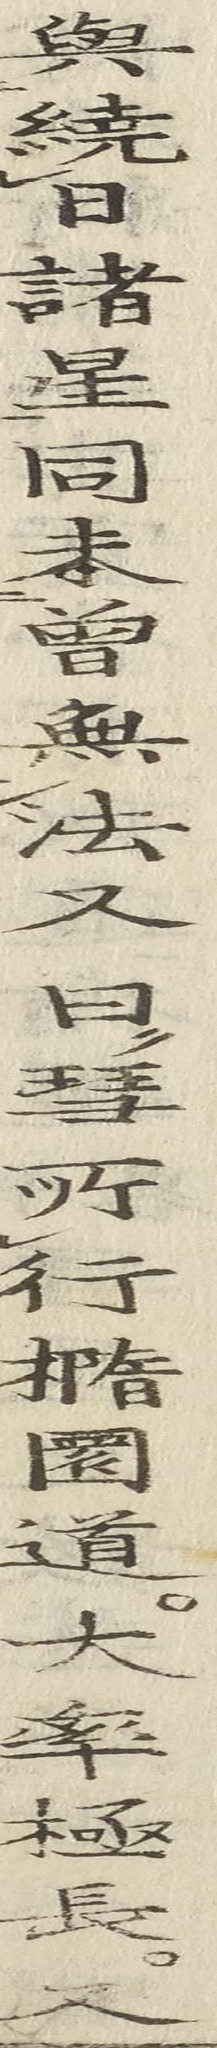与ニ繞日諸星同未ニ曽無レ法又曰彗所行楕園道。大率極長。又

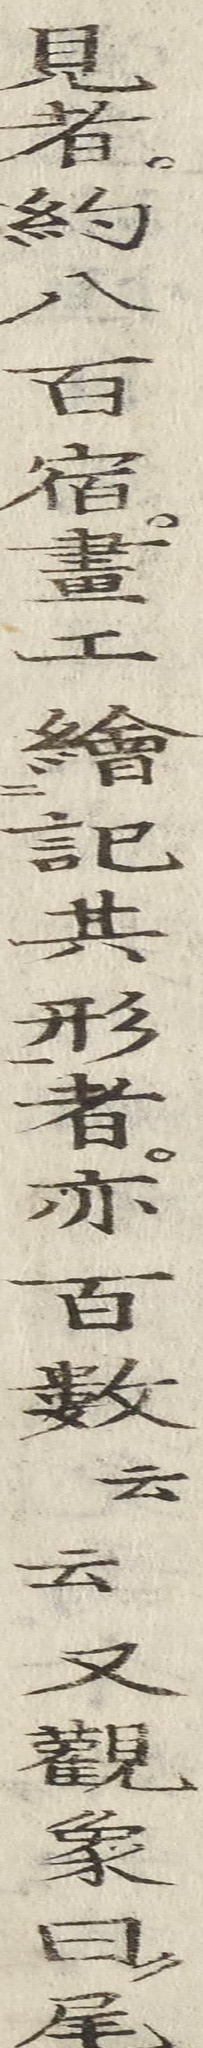見者。約八百宿。画工絵ニ記其形者。亦百数云云又観象曰尾
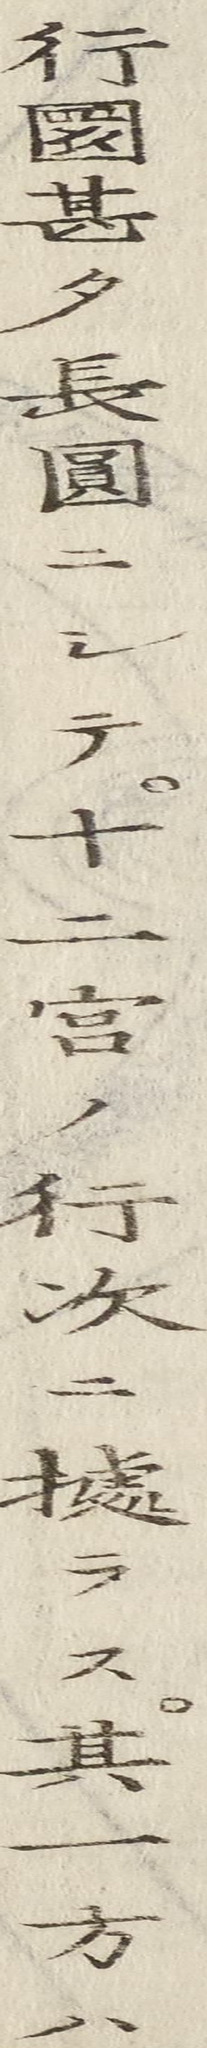行園甚タ長円ニシテ。十二宮ノ行次ニ拠ラス。其一方ハ
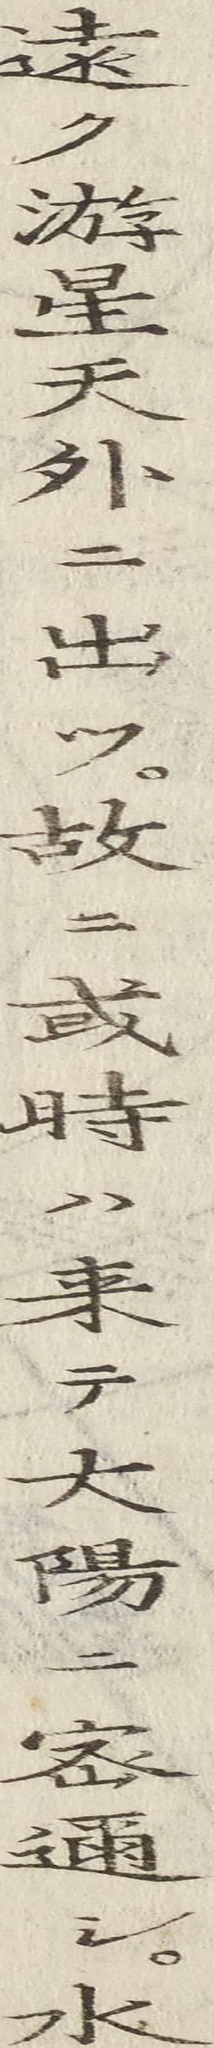遠ク游星天外ニ出ツ。故ニ或時ハ来テ大陽ニ密邇シ。水
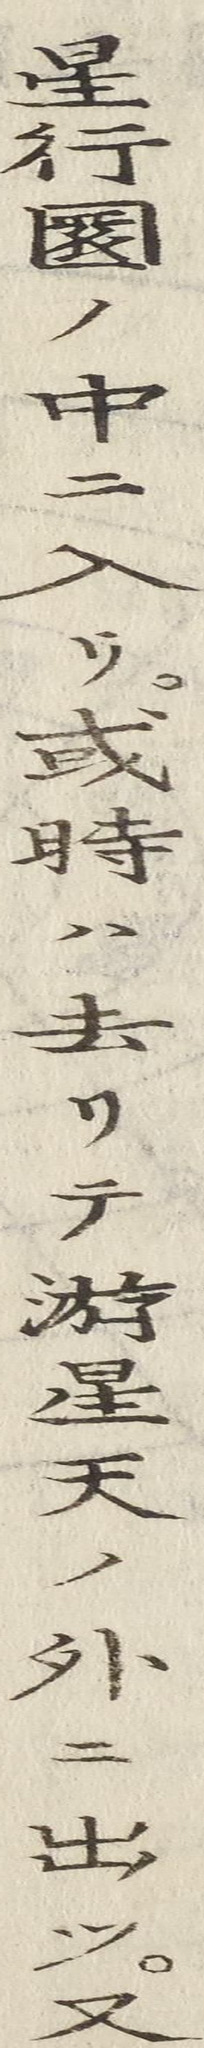星行園ノ中ニ入リ。或時ハ去リテ游星天ノ外ニ出ツ。又
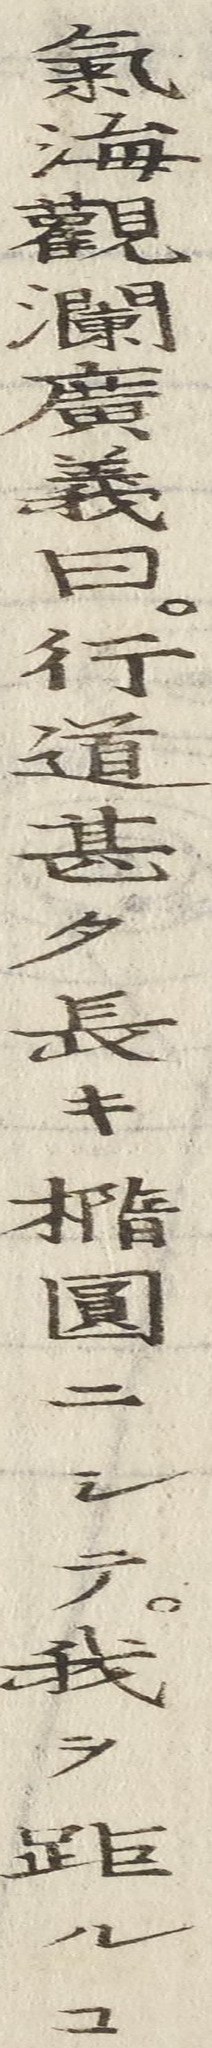気海観瀾広義曰。行道甚タ長キ楕円ニシテ。我ヲ距ルコ
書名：護法新論　二編　下
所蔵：東京大学地震研究所図書室 Earthquake Research Institute Library, The University of Tokyo, JAPAN
